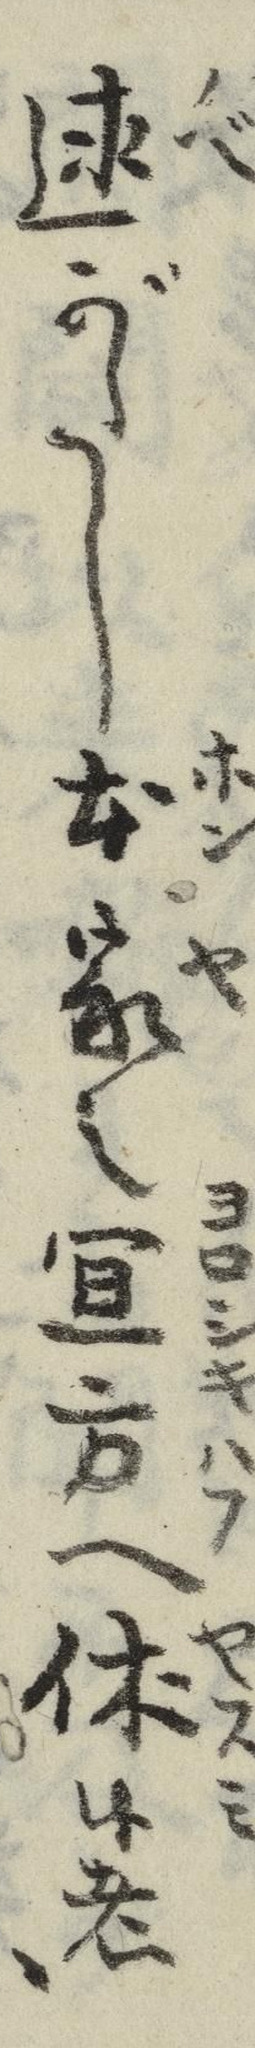述がたし本家之宜方へ休候者ハ
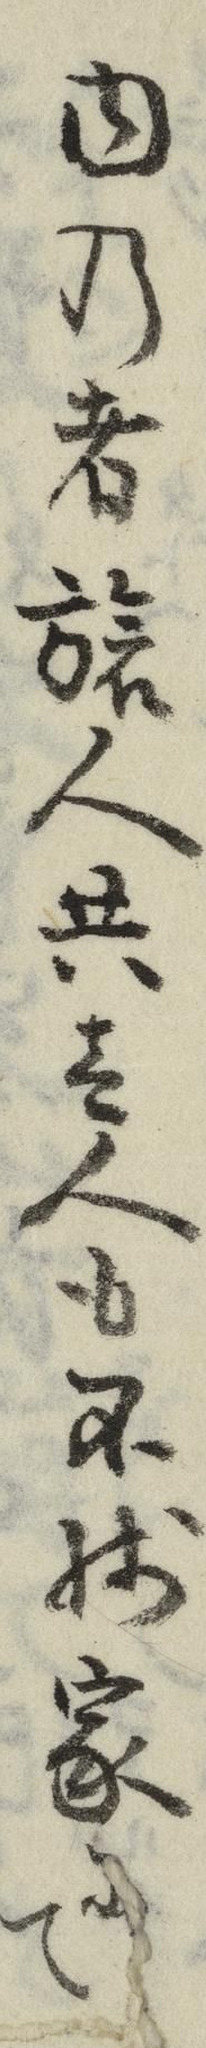内乃者旅人共壱人も不残家にて
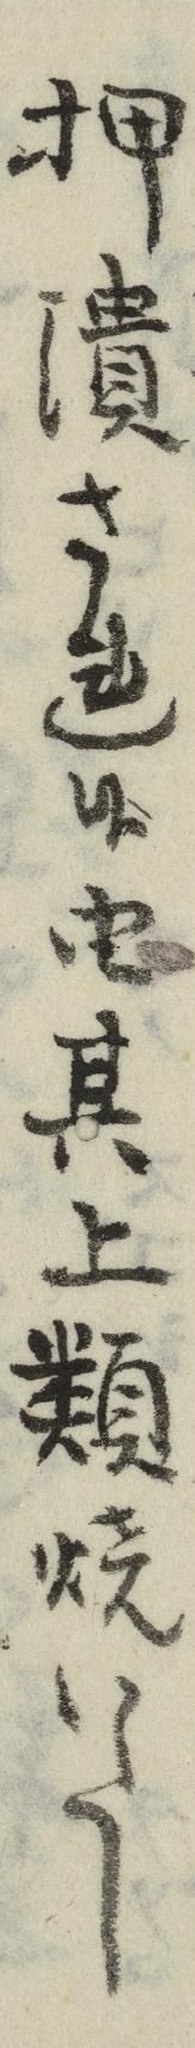押潰され候由そ上類焼いたし
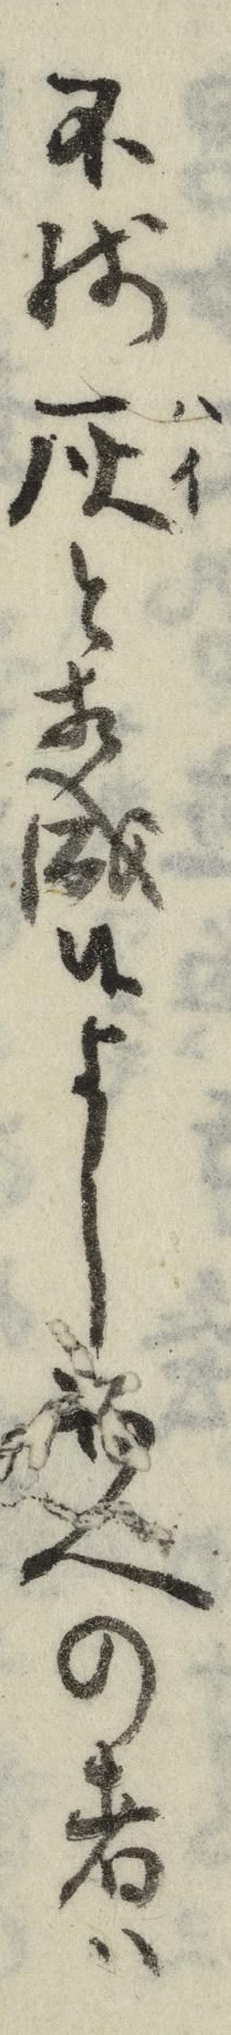不残灰と相成候よし五人の者ハ
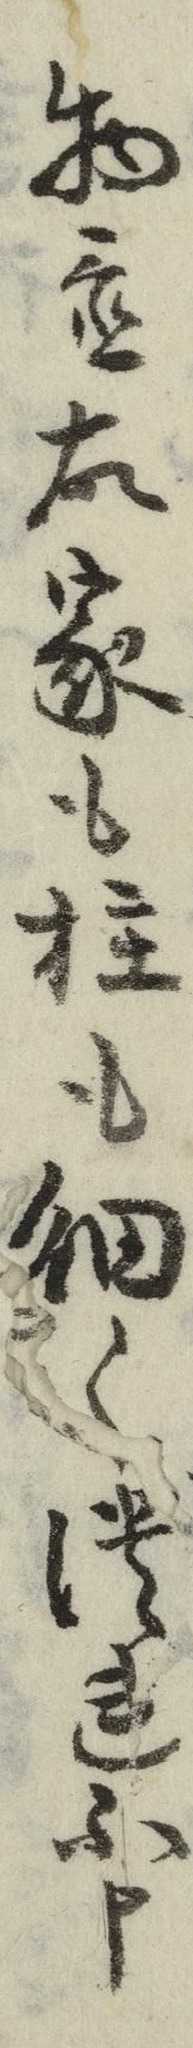物置故家も柱も細く潰れ不申
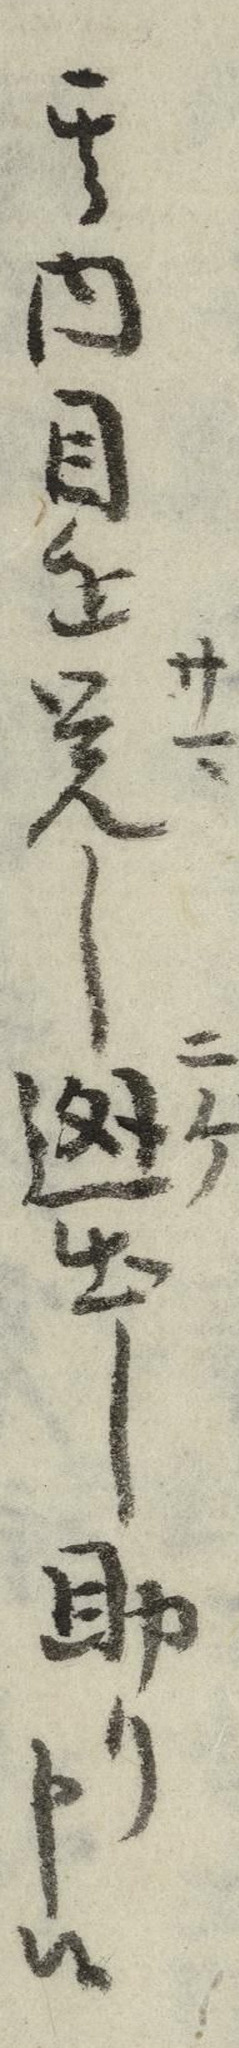其内目を覚し逃出し助り申候
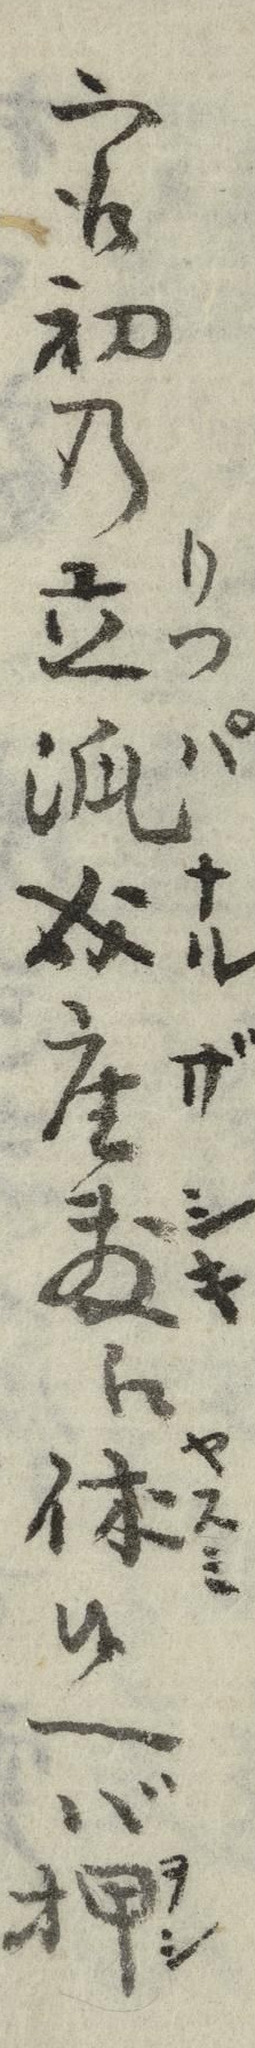最初乃立派成座敷え休候へバ押
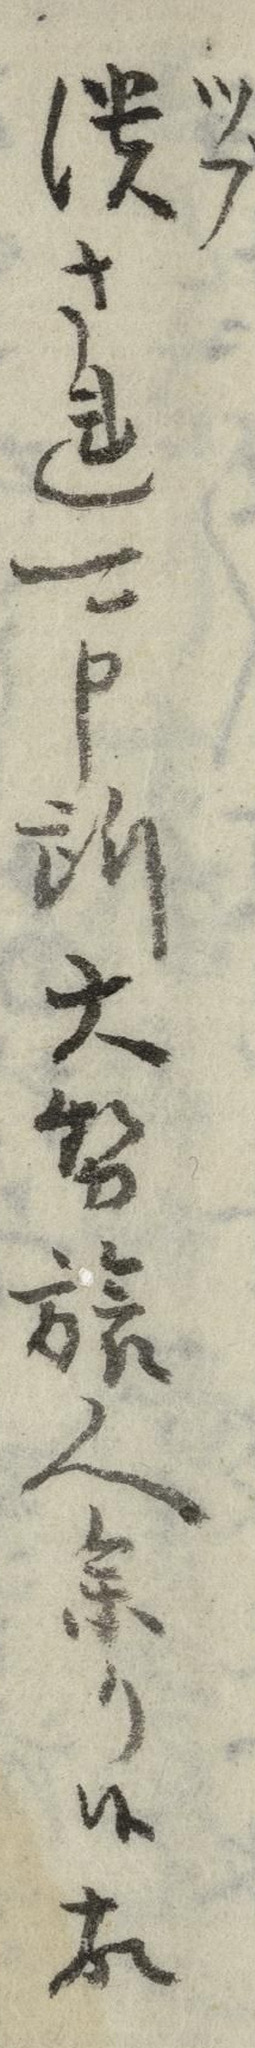潰され可申所大勢旅人参り候故
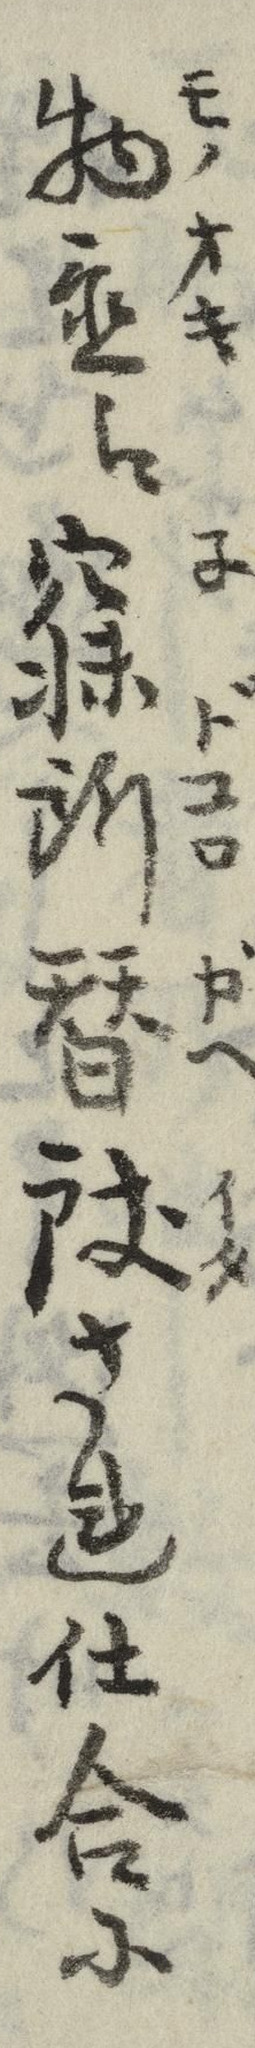物置え寝所替致され仕合に
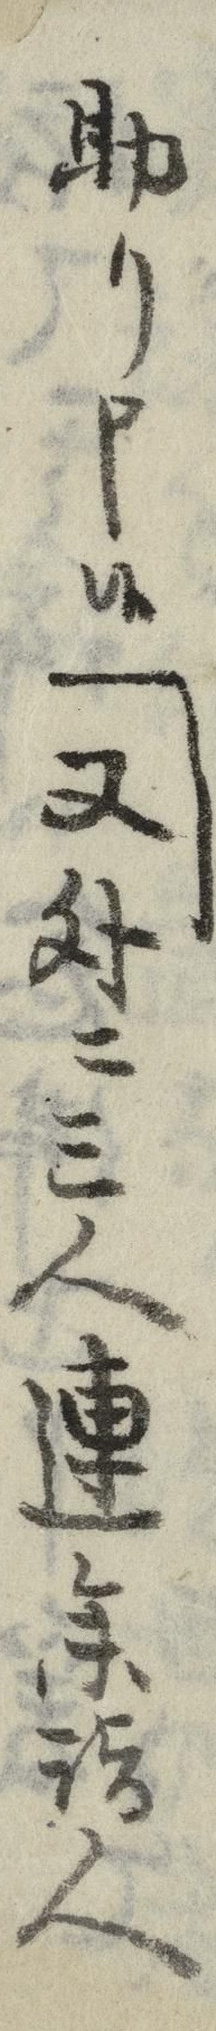助り申候又外二三人連参詣人
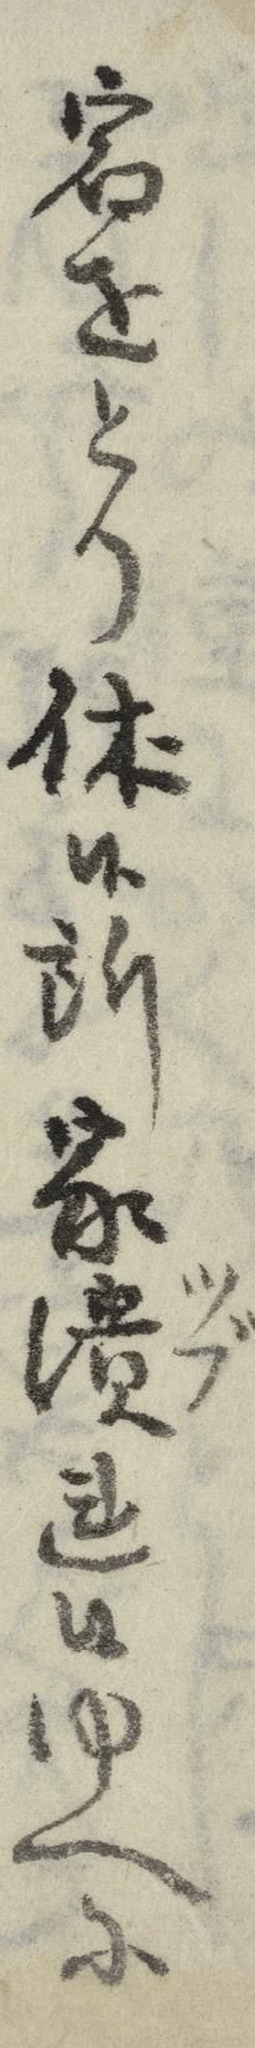宿をとり休候所家潰れ候ゆへに
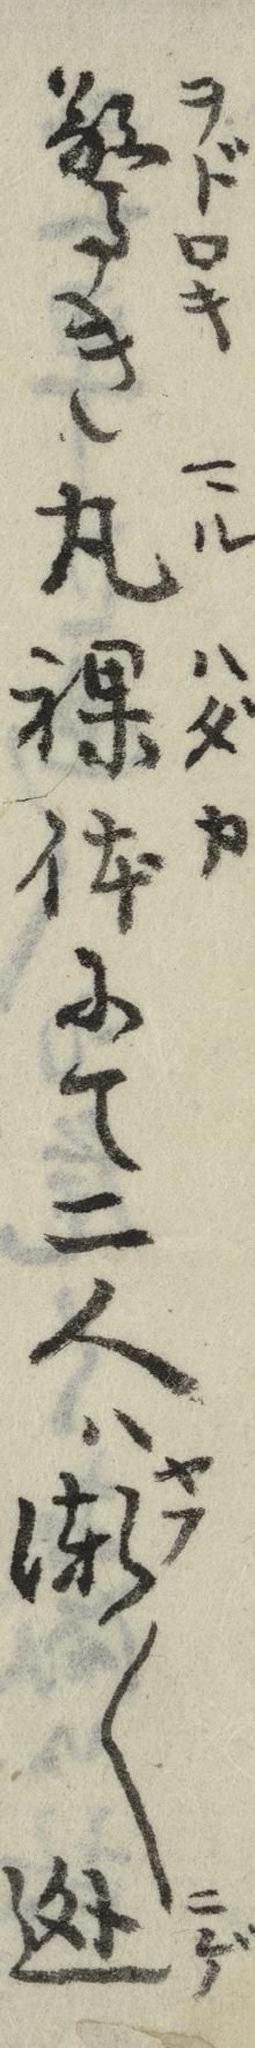驚き丸裸体にて二人ハ漸〳〵逃
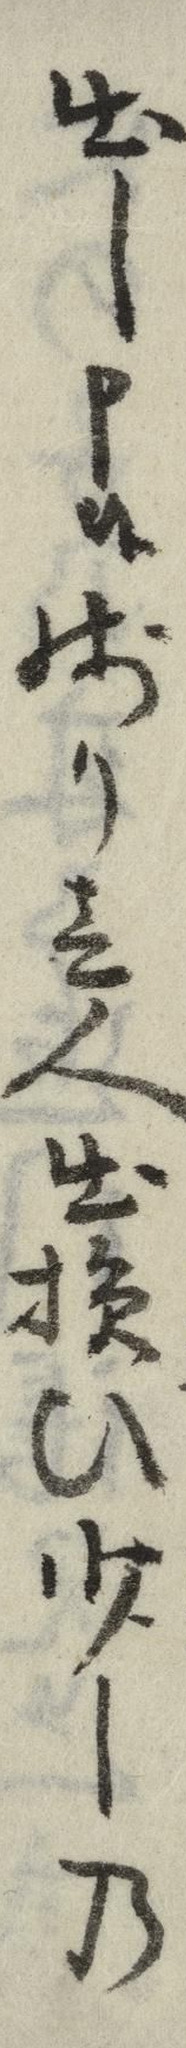出し申候残り壱人出損ひ少し乃
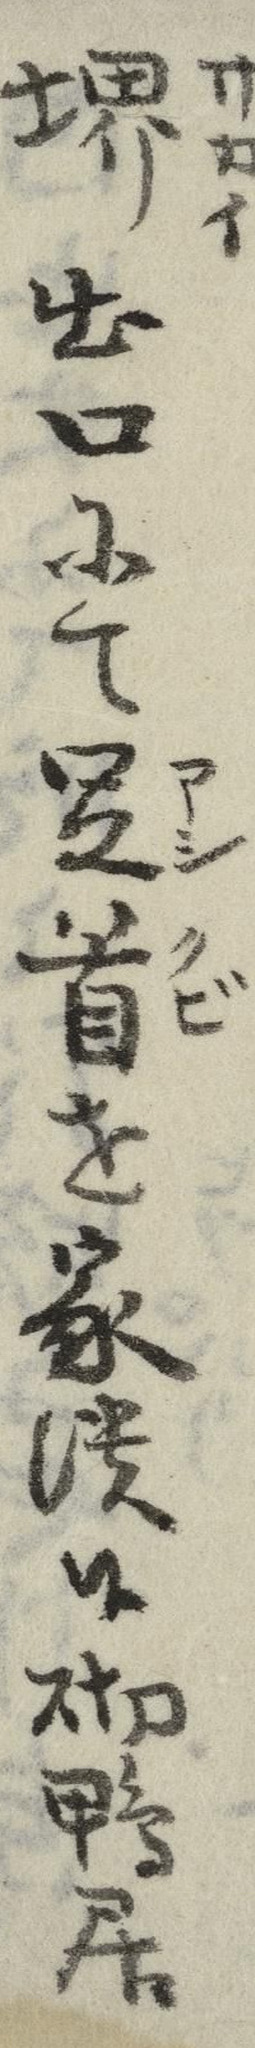堺出口にて足首を家潰候砌鴨居
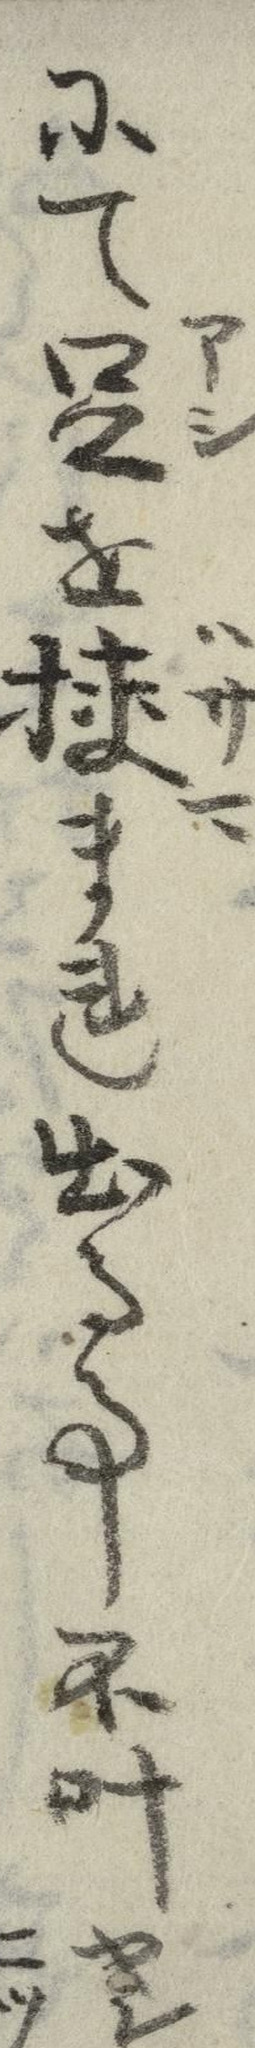にて足を挟まれ出る事不叶ヤレ
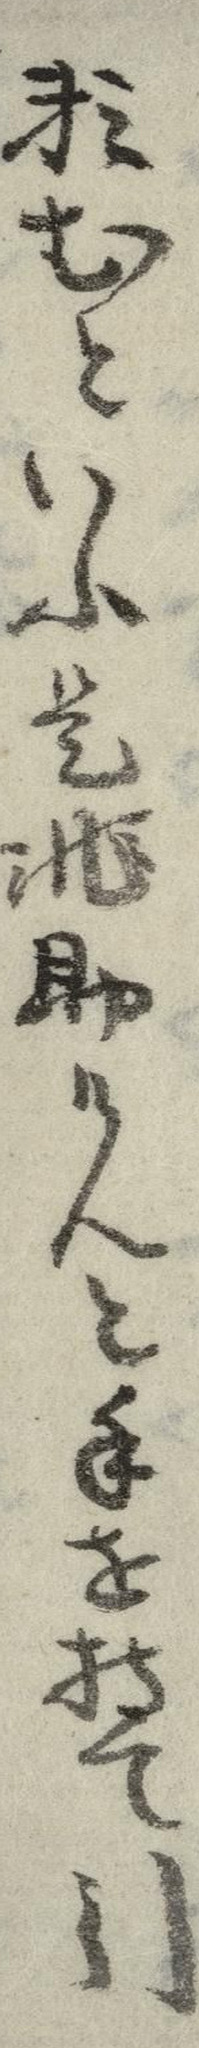頼むといふ是非助けんと手を持て引
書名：信州大地震一件之冩　丁未弘化四年三月吉日
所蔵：東京大学地震研究所図書室 Earthquake Research Institute Library, The University of Tokyo, JAPAN
